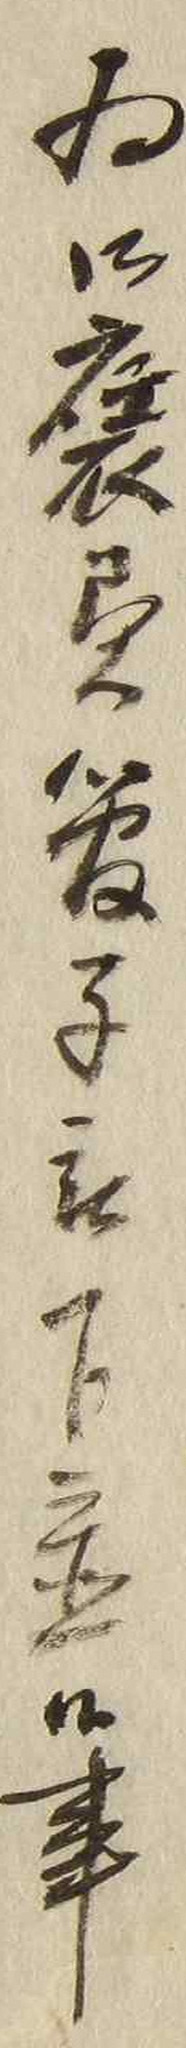為御褒美管子被下置候事

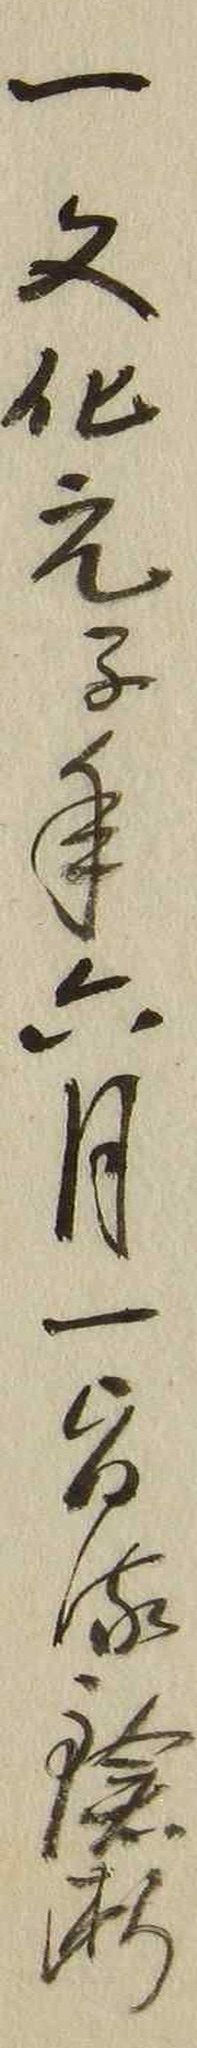一文化元子年六月一旨流鎗術
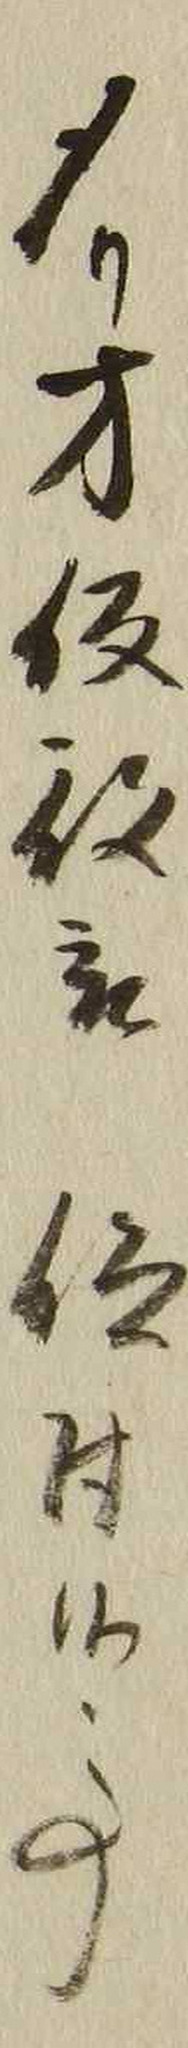〆り方仮役被仰付候事
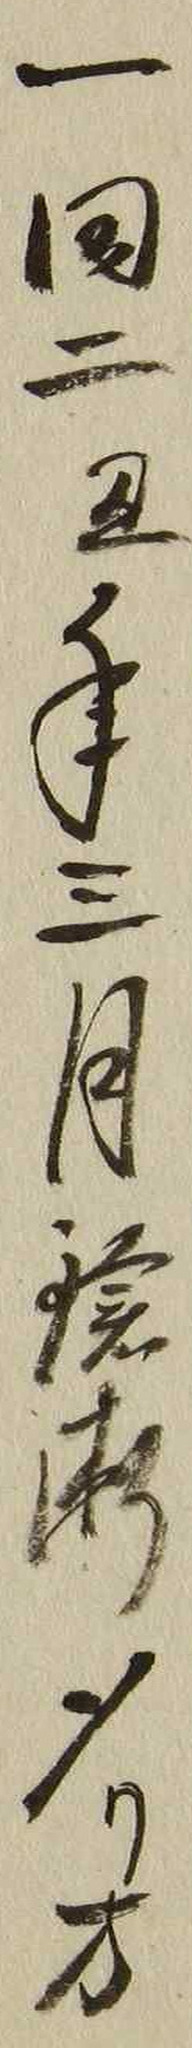一同二丑年三月鎗術〆り方
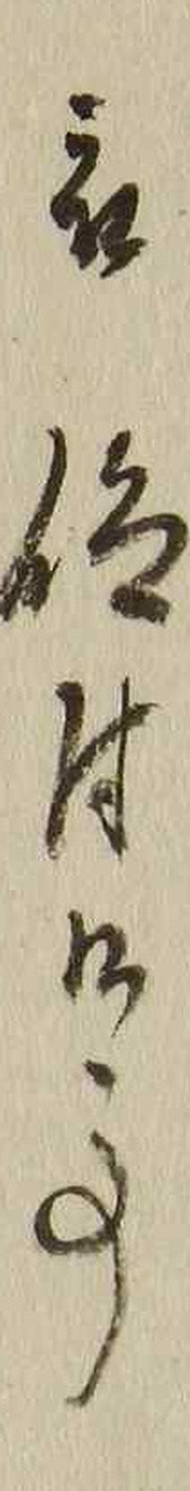被仰付候事
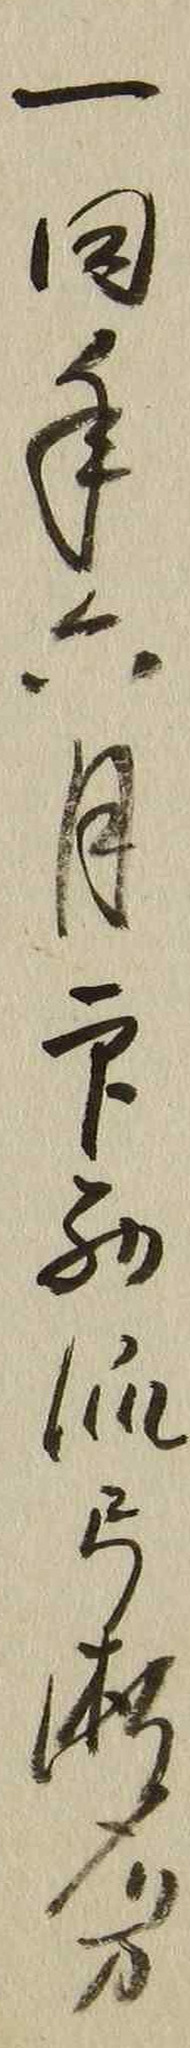一同年六月印西派弓術〆り方
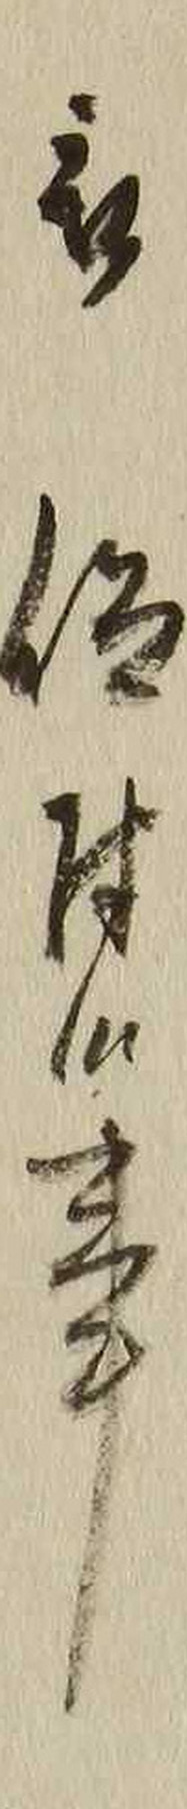被仰付候事
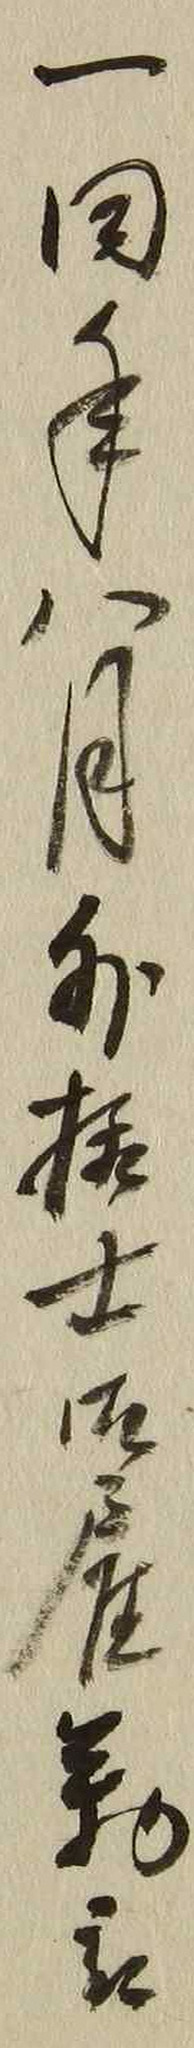一同年八月外様士御雇勤被
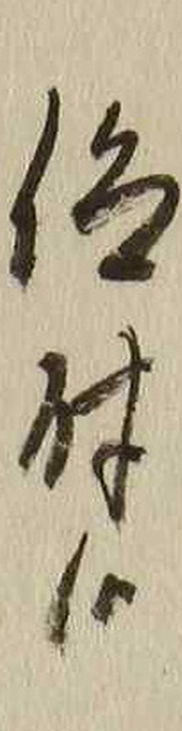仰付候
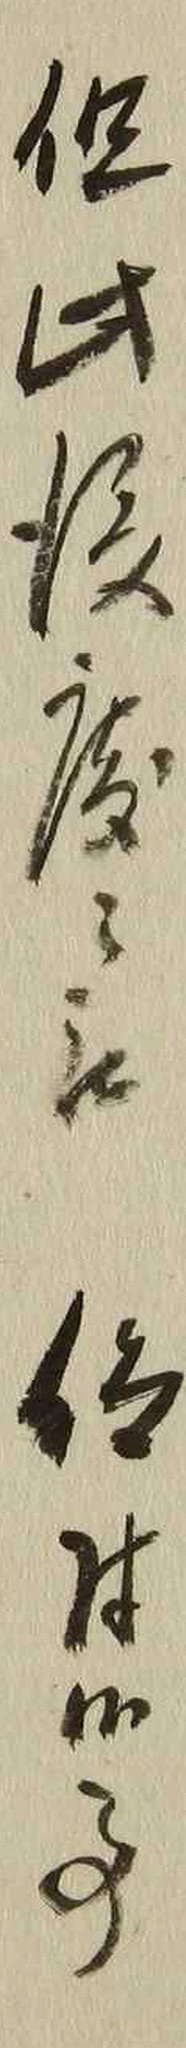但此後度々被仰付候事
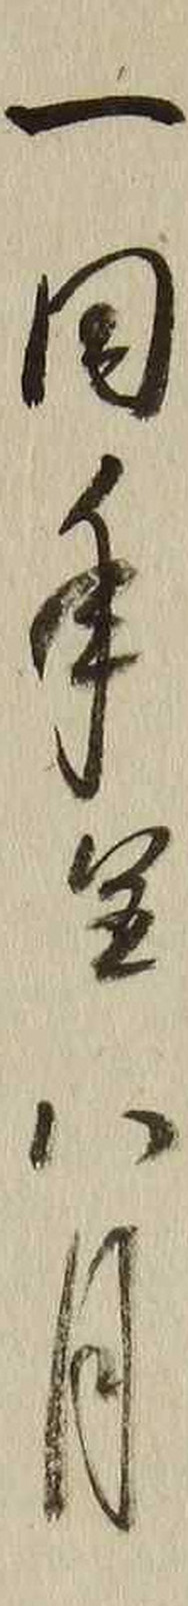一同年閏八月
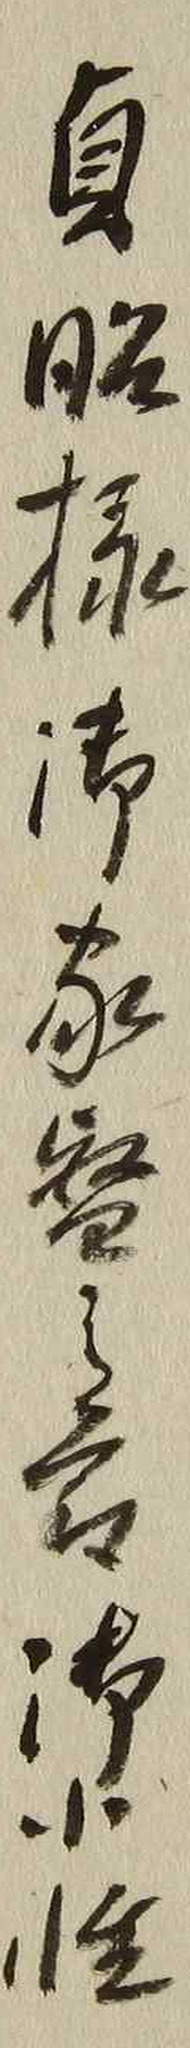貞昭様御家督之節御小性
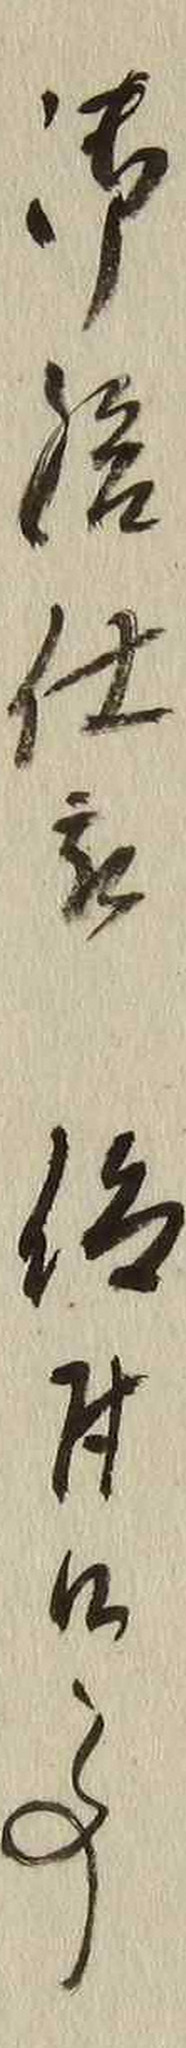御給仕被仰付候事
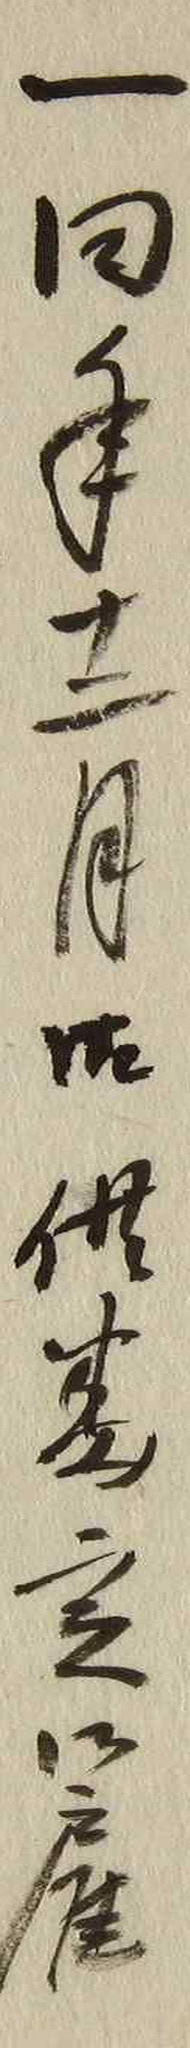一同年十二月御供番定御雇
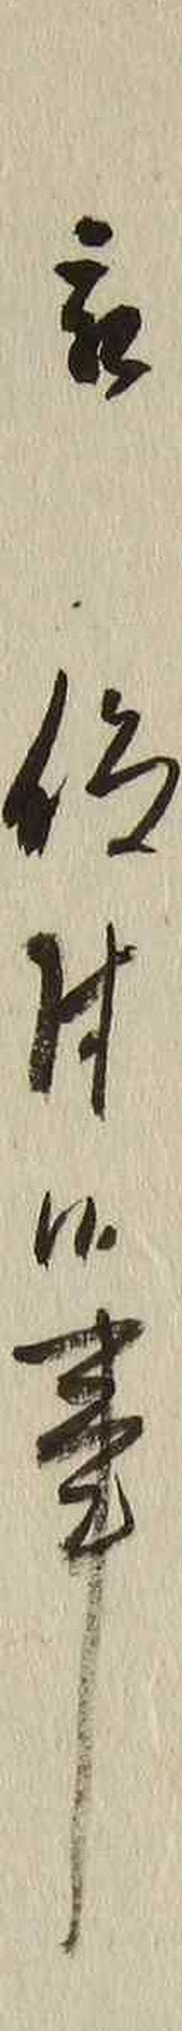被仰付候事
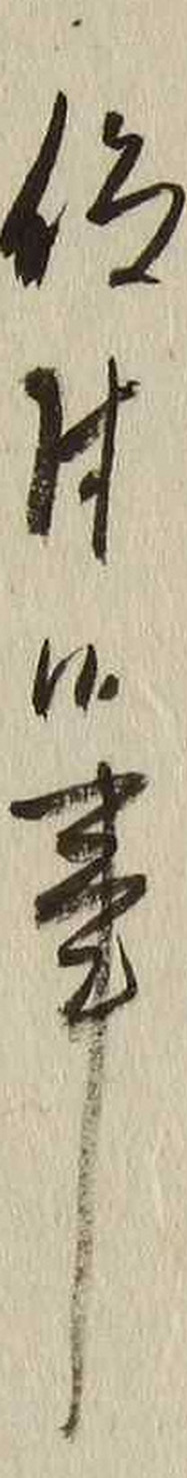仰付候事
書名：諸士系譜　巻之359　す之部9
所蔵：会津若松市立会津図書館
